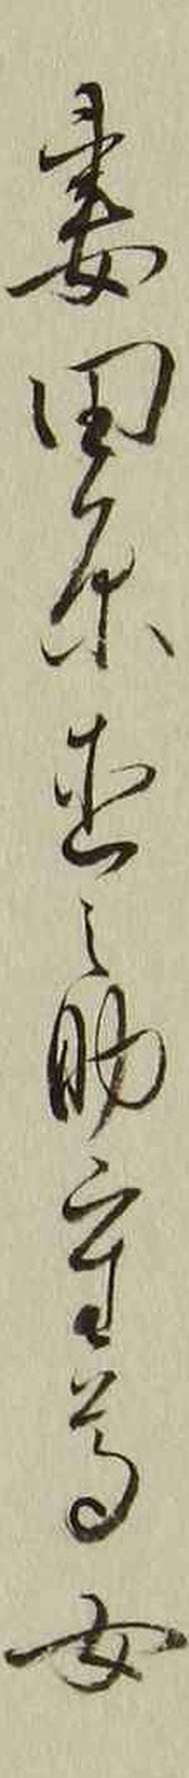妻田原直之助守尊女
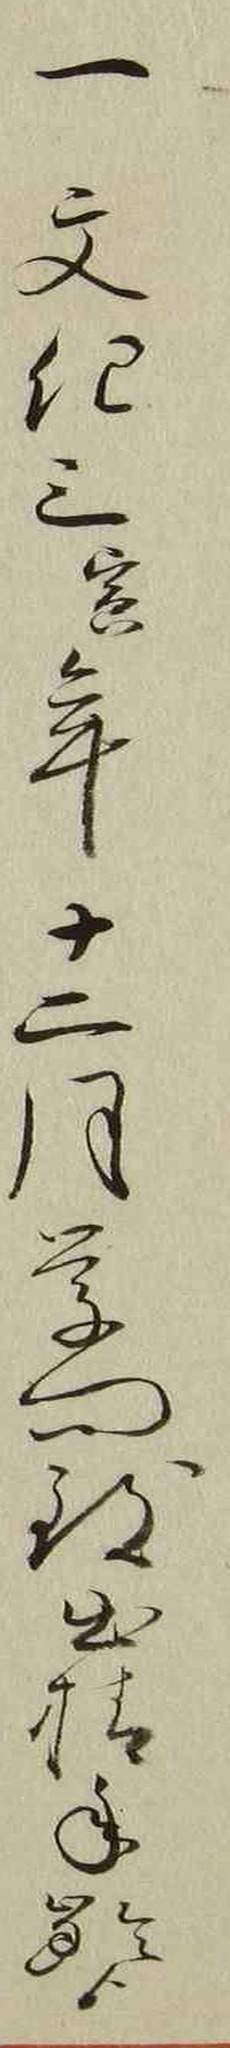一文化三寅年十二月学問致出精年齢ゟ
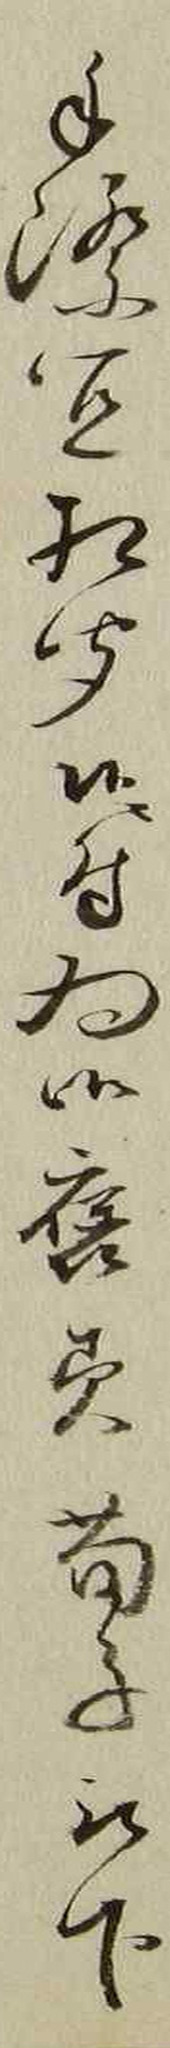手際宜相聞候に付為御褒美荀子被下
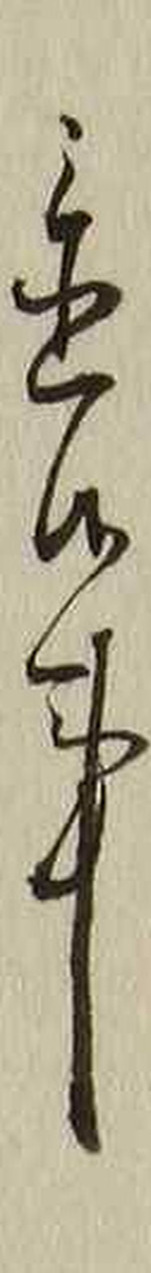置候事
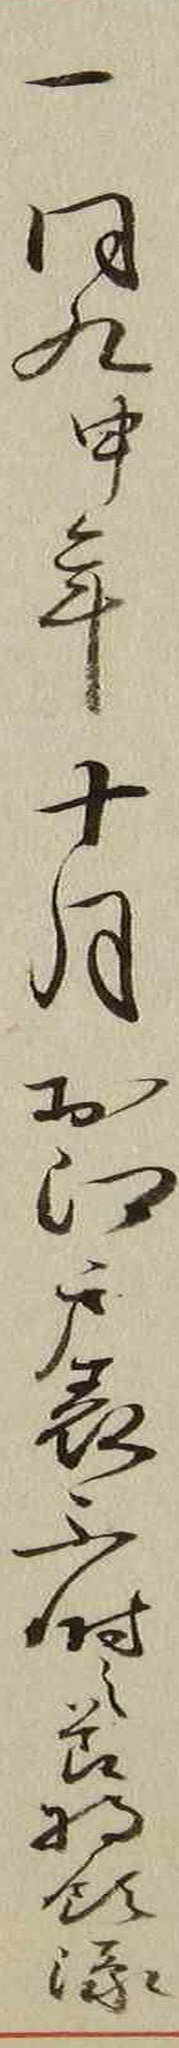一同九申年十月於江戸表不時之節将領隊
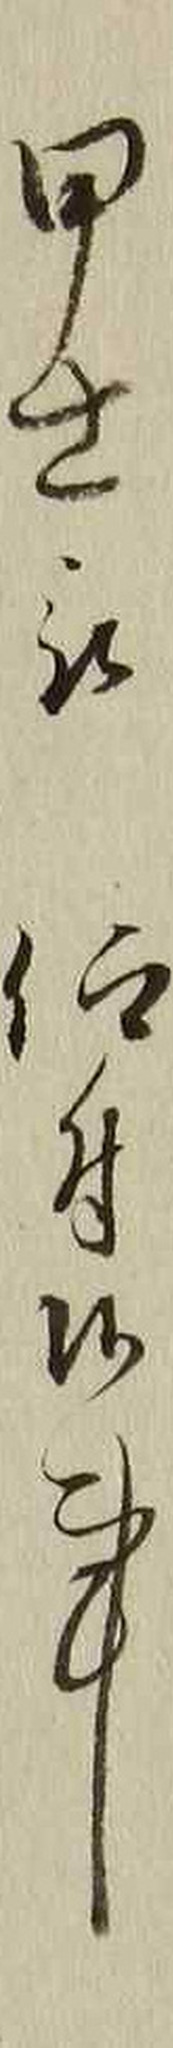甲士被仰付候事
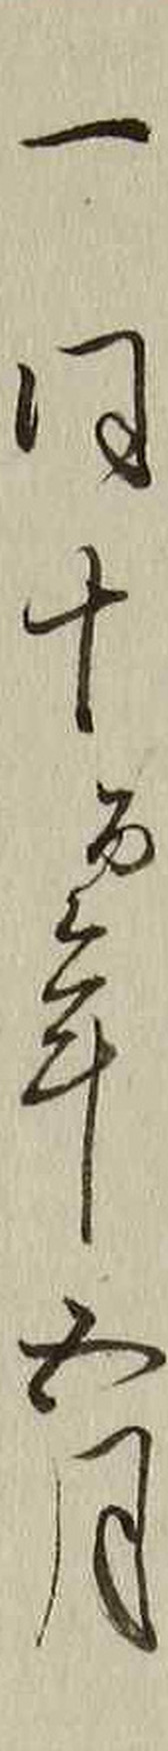一同十酉年五月
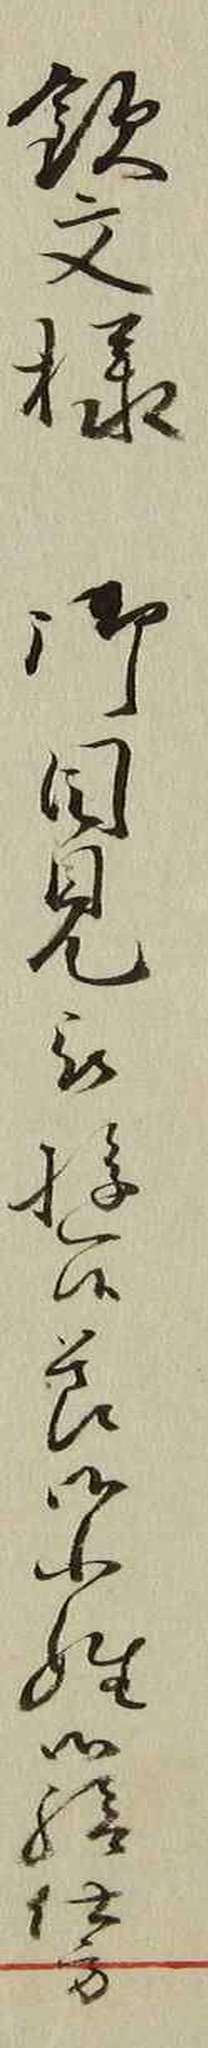欽文様御目見被遊候節御小姓御給仕方
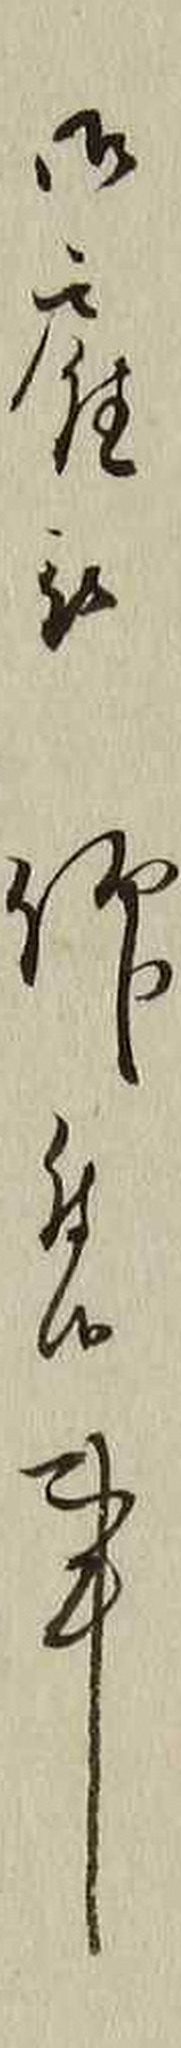御雇被仰付候事
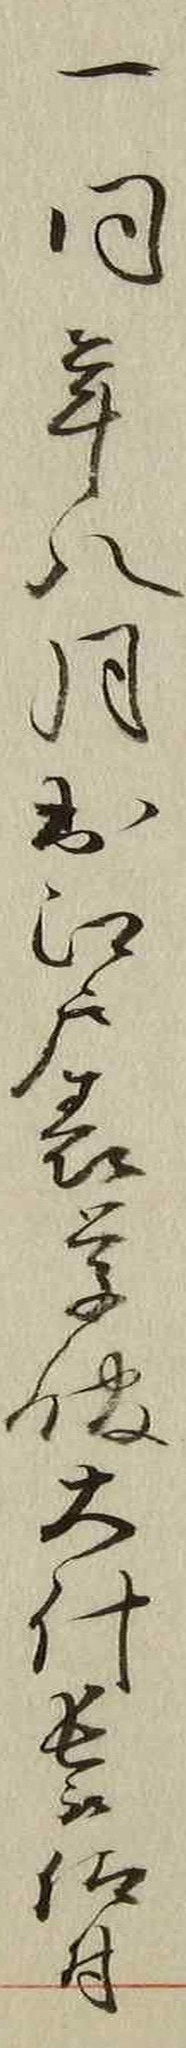一同年八月於江戸表学館大什長被仰付
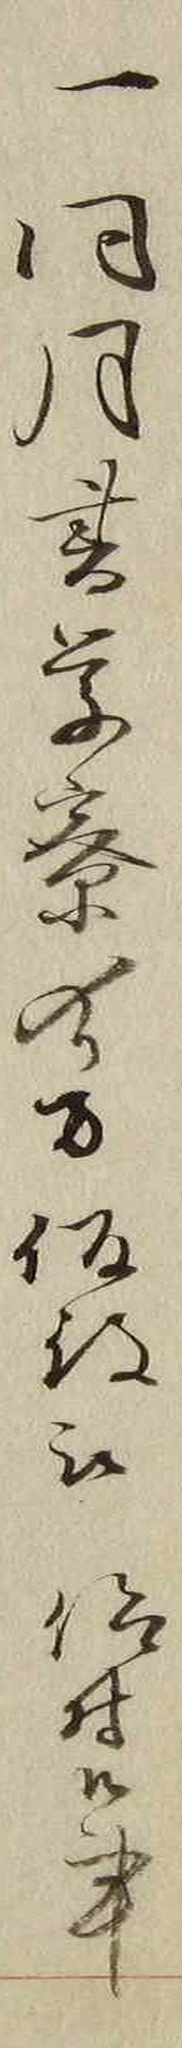一同月書学寮〆り方仮役被仰付候事
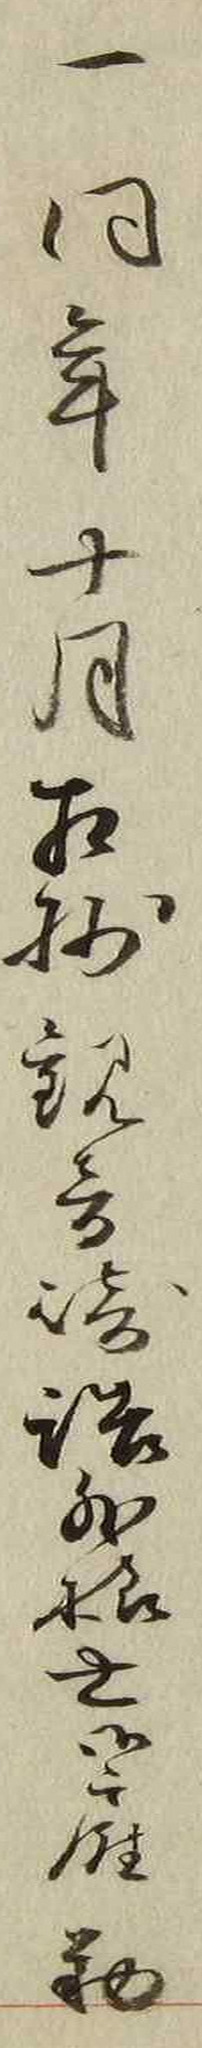一同年十月相州観音崎詰外様士御雇勤
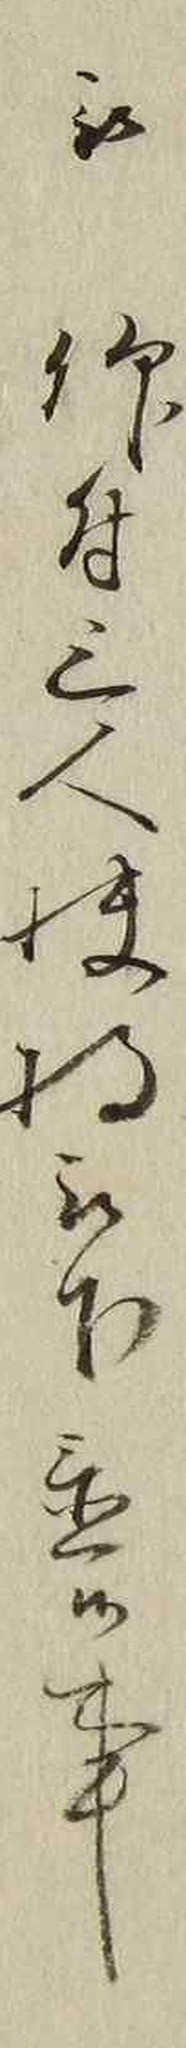被仰付三人扶持被下置候事
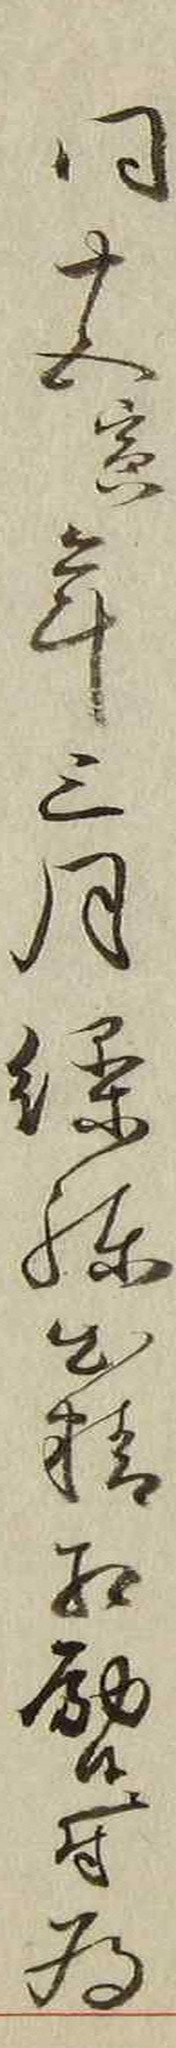一同十五寅年三月繰練出精相励候に付為
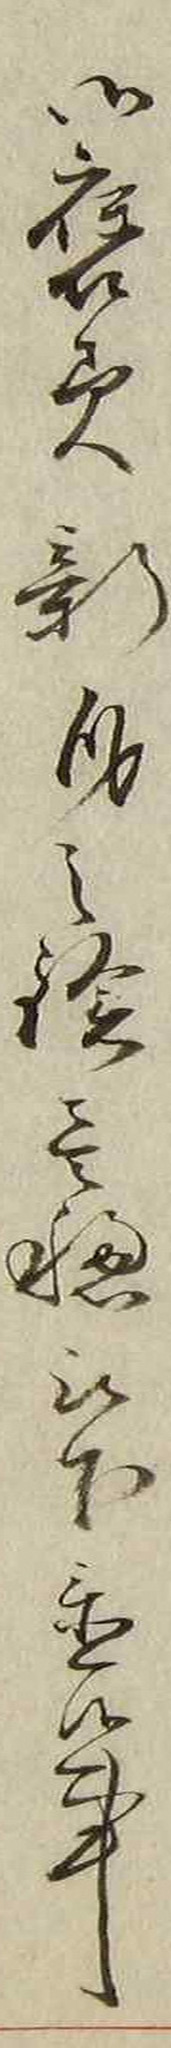御褒美新身之鎗壱穂被下置候事
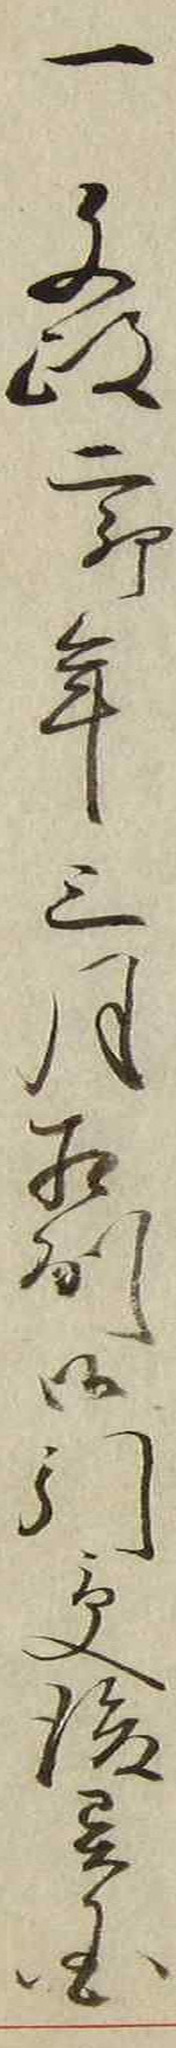一文政二卯年三月相州御引受後異国
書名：諸士系譜　巻之3　い之部3
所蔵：会津若松市立会津図書館
